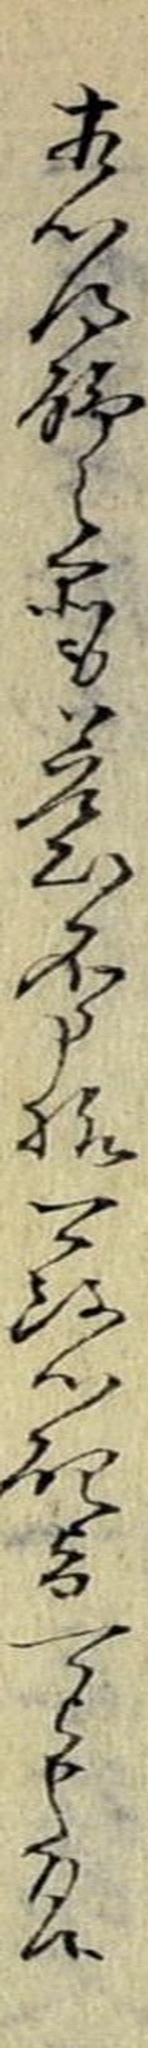相心得聊之品も差出不申様可致心配旨可被申付候
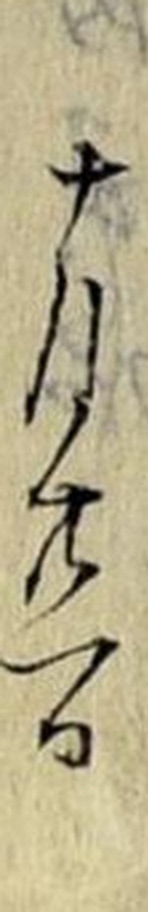十月廿一日
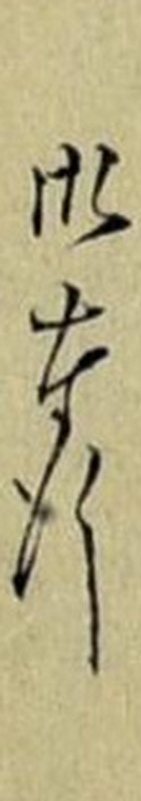御奉行
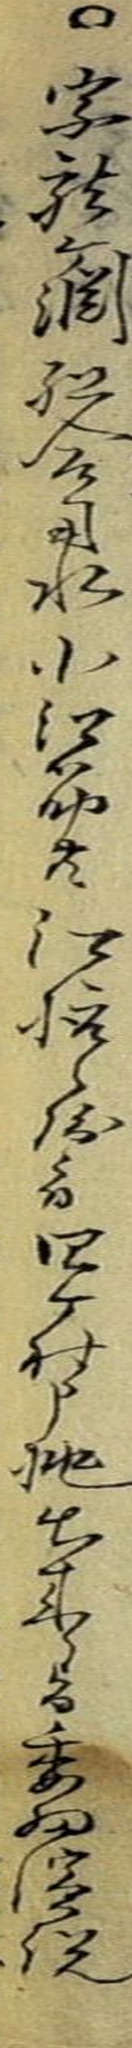○字龍ヶ淵組合用水小江筋共江浚之儀に付四ヶ村申談出来候旨委細演説
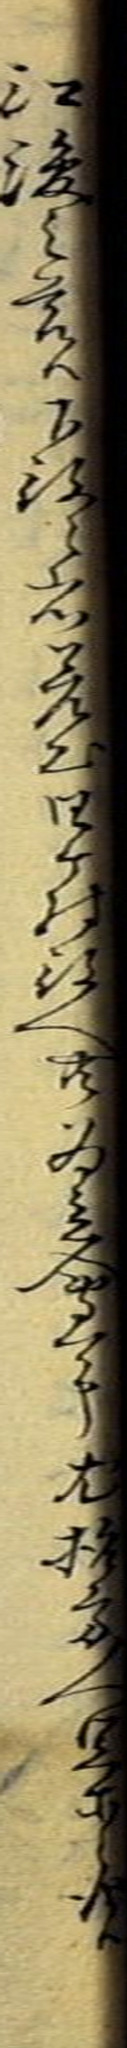江浚之節は下役之者差出四ヶ村役人共為立会可申尤格方人足等之儀は
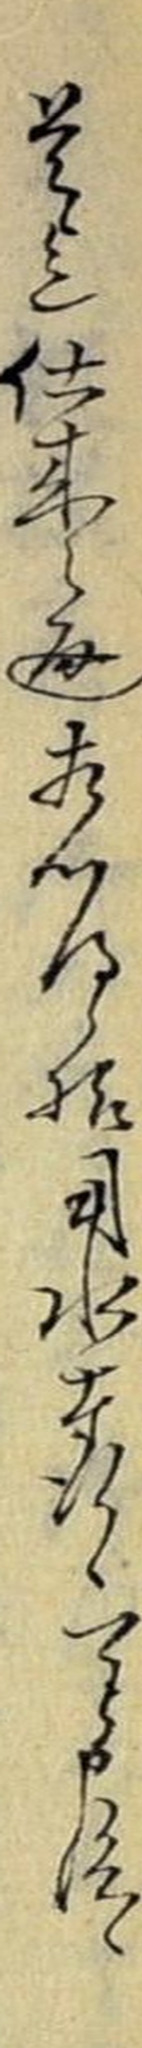是迄仕来候通相心得候様用水奉行へ可被申渡候
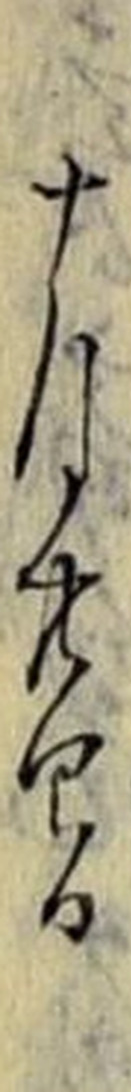十月廿四日
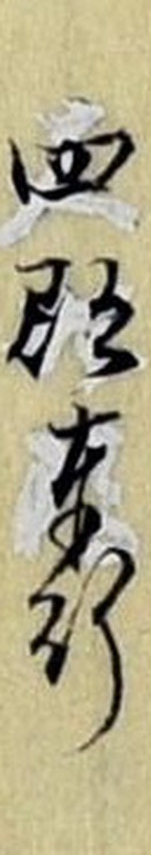四郡奉行
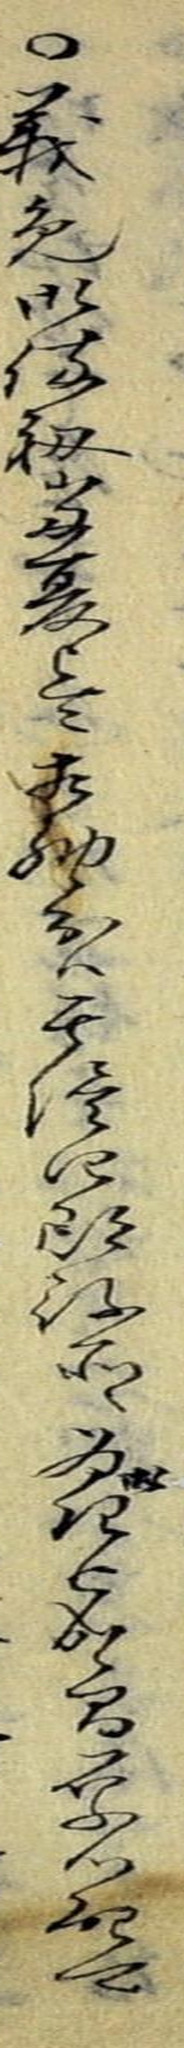○義免御備籾当夏迄に相納候分は其侭四郡役所へ為御任被成候間厚心配可
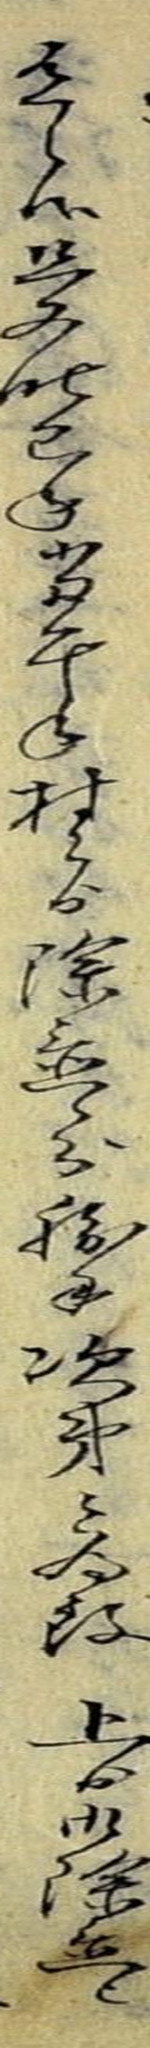有之候且又昨巳年当午年村々ゟ除置候分勝手次第に為致上ゟ御除置被
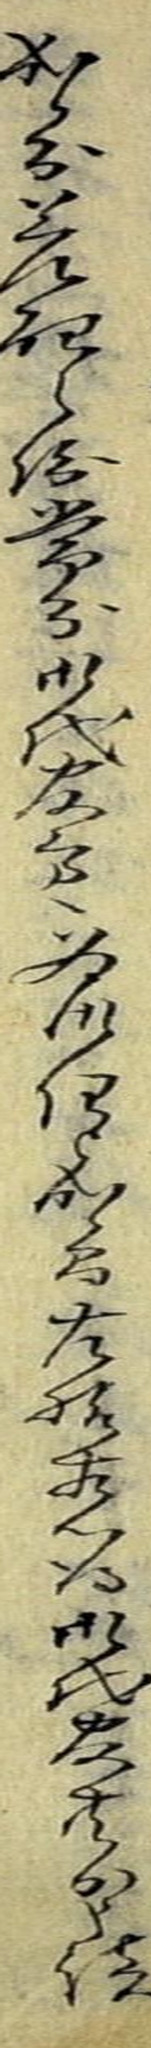成候分差配之儀当分御代官方へ為御任被成候間左様相心得御代官共ゟ申談
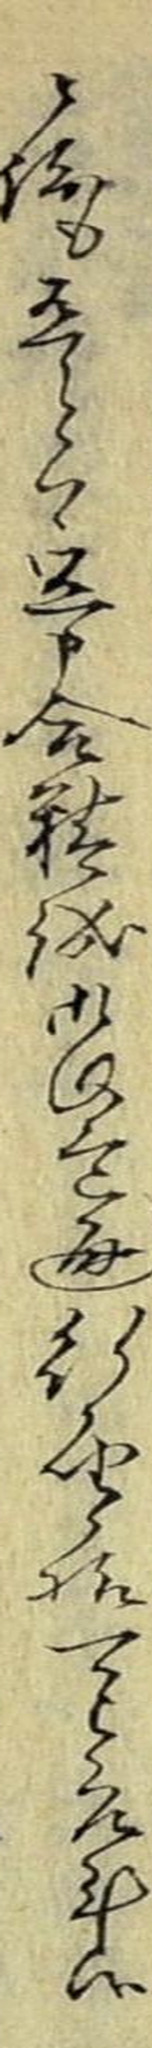候儀も有之候はヽ宜申合精誠御趣意通行届候様可被取斗候
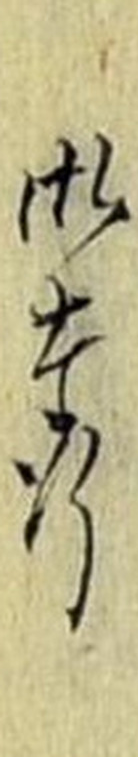御奉行
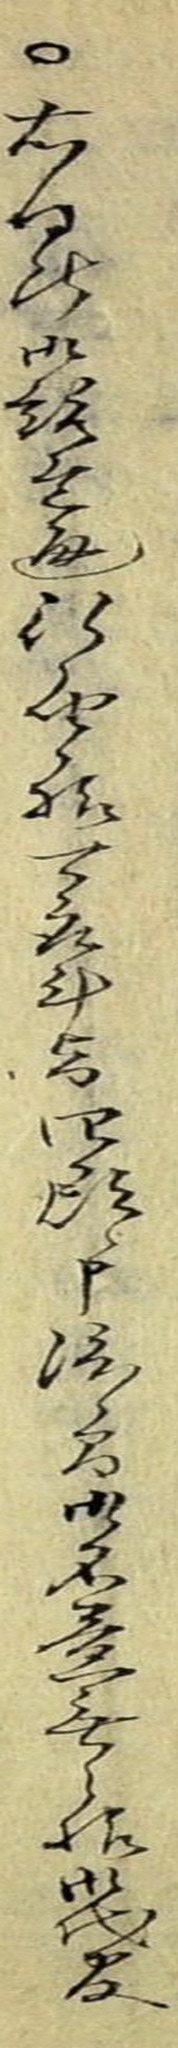○右同断御趣意通行届候様可取斗旨四郡へ申渡候間御不益無之様御代官
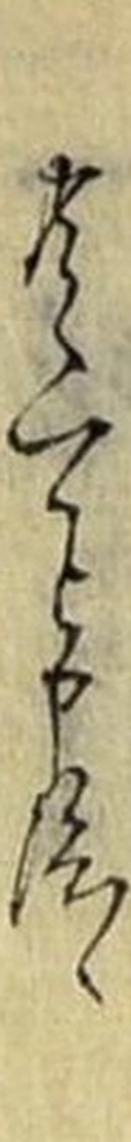共へ可被申渡候
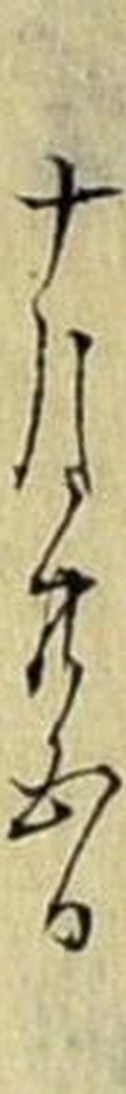十月廿五日
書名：命令之部 六
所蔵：福井県文書館 Fukui Prefectural Archives
